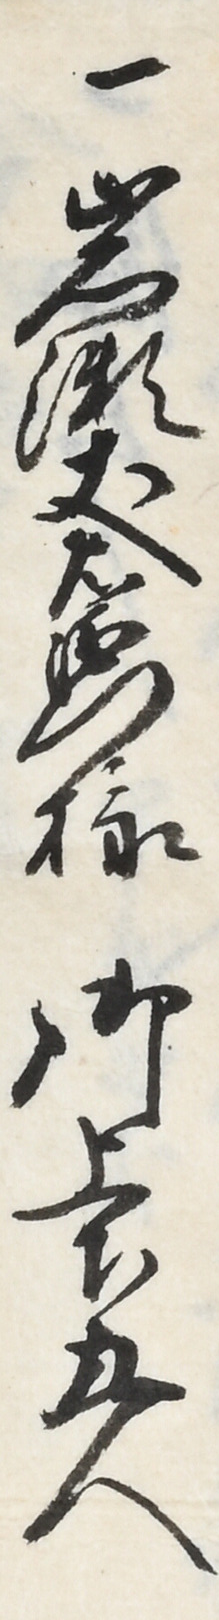一岩瀬丈右衛門様御上下五人
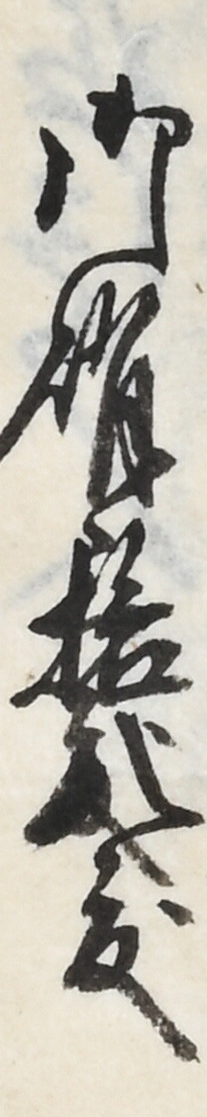御賄拾弐度
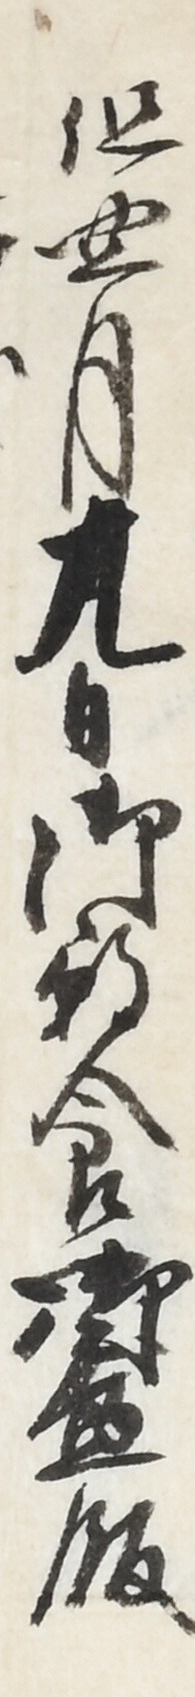但四月廿日御朝食御昼飯
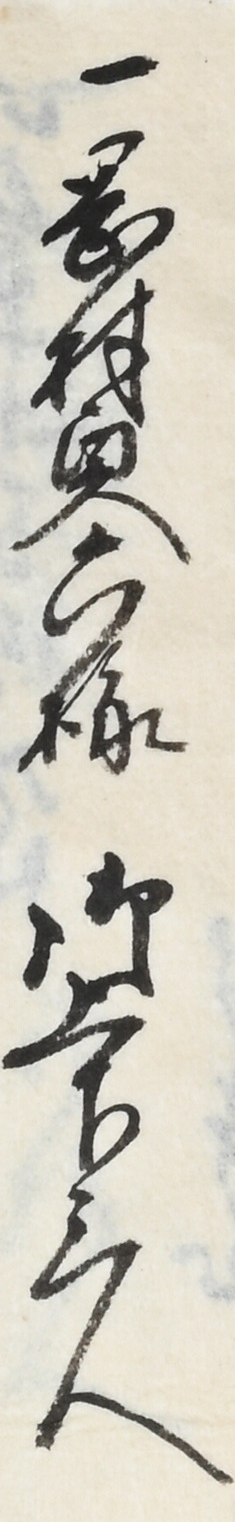一岡村貞六様御上下三人
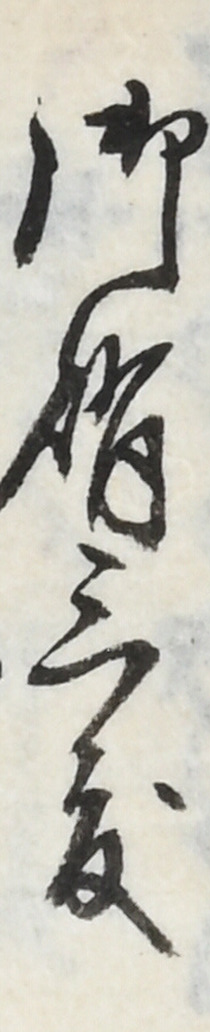御賄三度
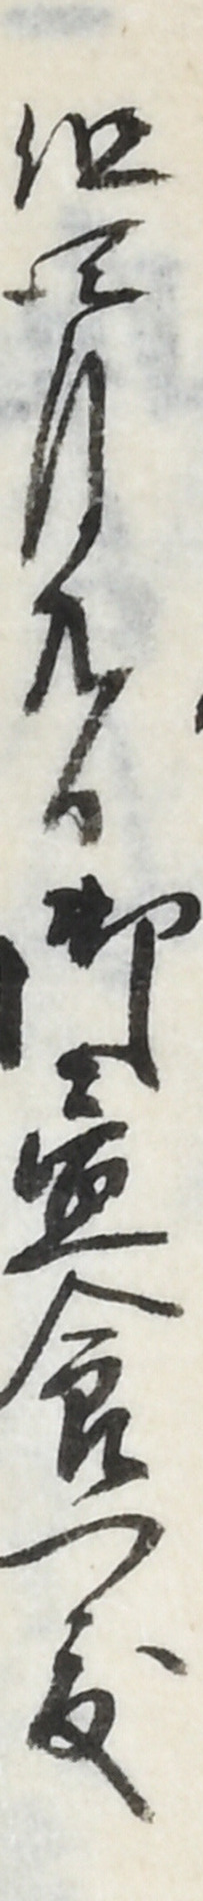但四月九日御昼食一度

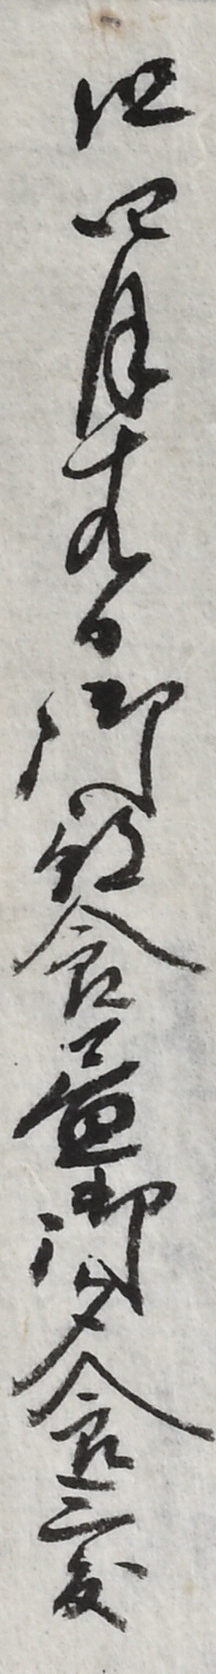但四月十九日御朝食昼御夕食三度
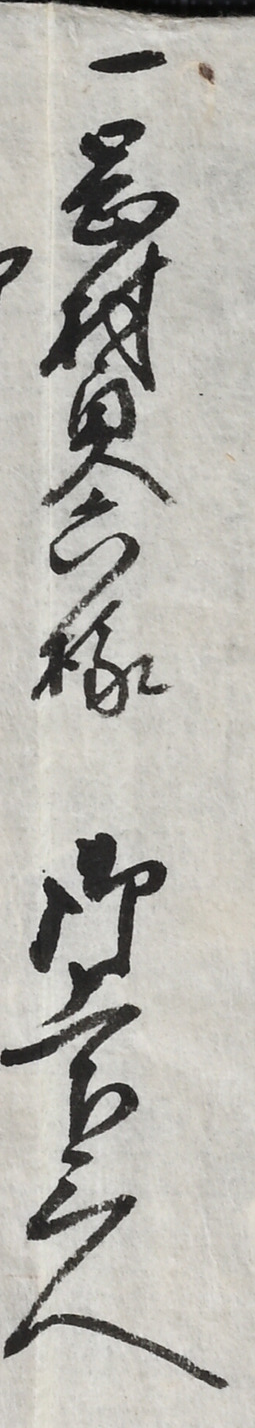一岡村貞六様御上下三人
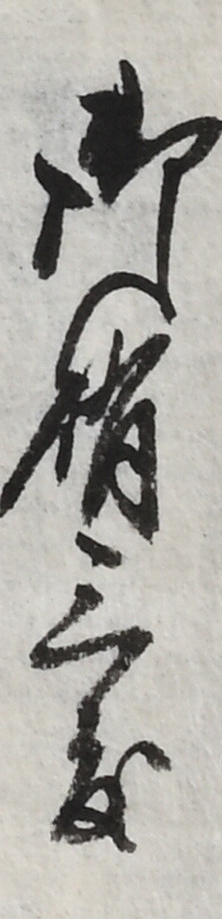御賄三度
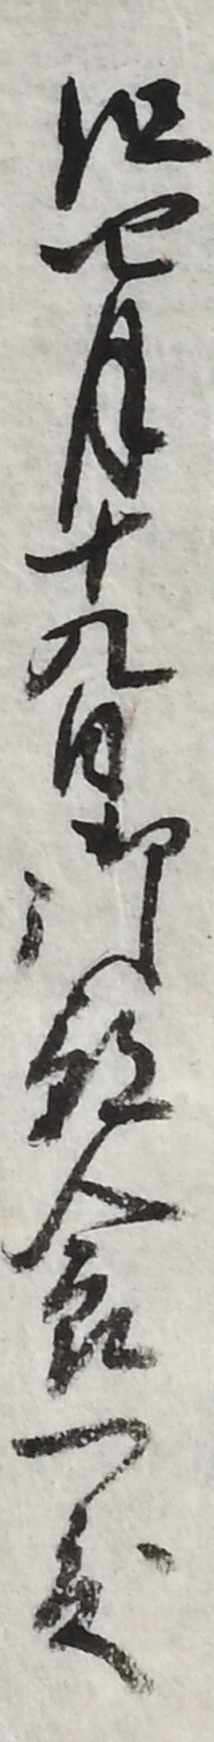但四月十九日御朝食一度
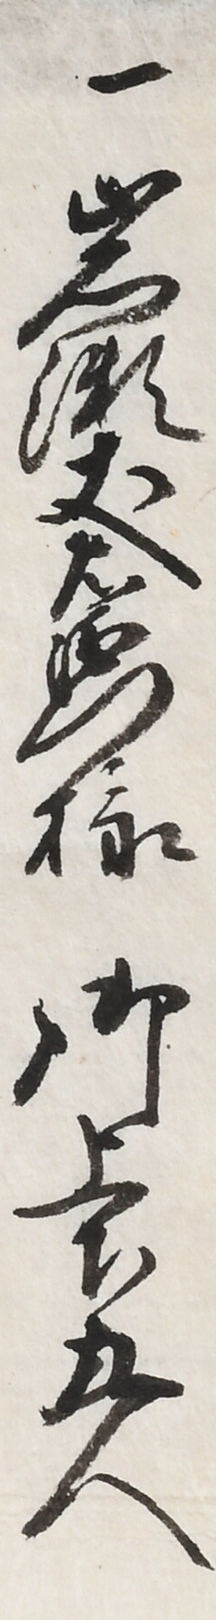一岩瀬丈右衛門様御上下五人
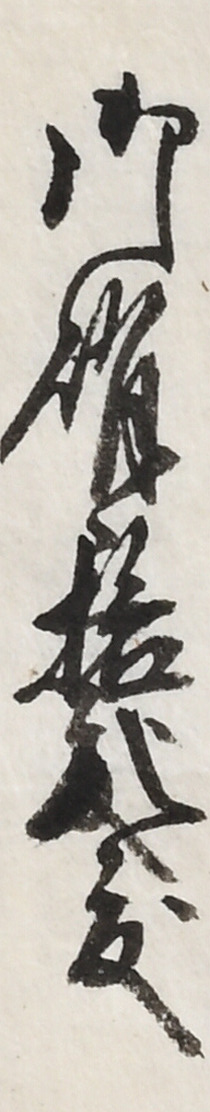御賄拾弐度
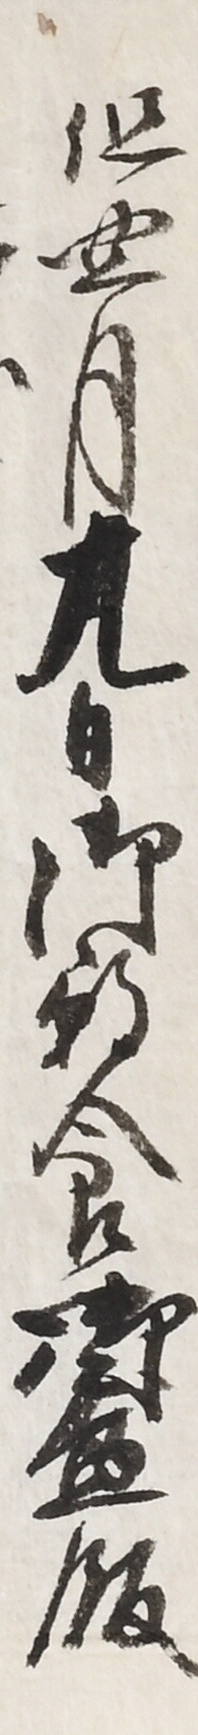但四月廿日御朝食御昼飯
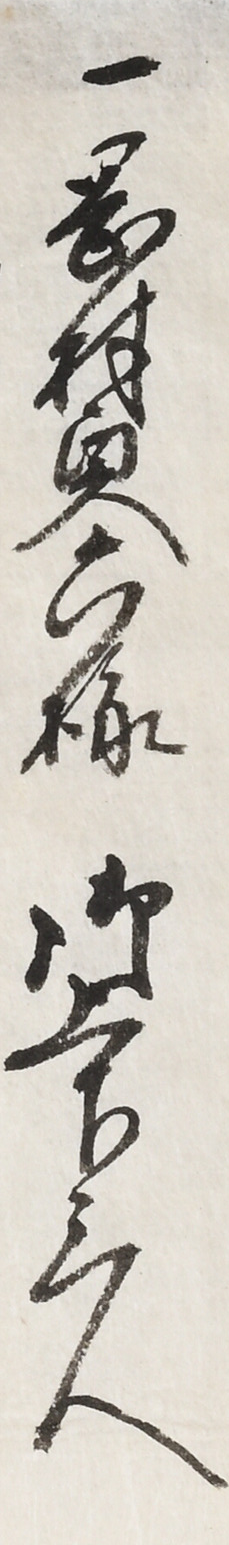一岡村貞六様御上下三人
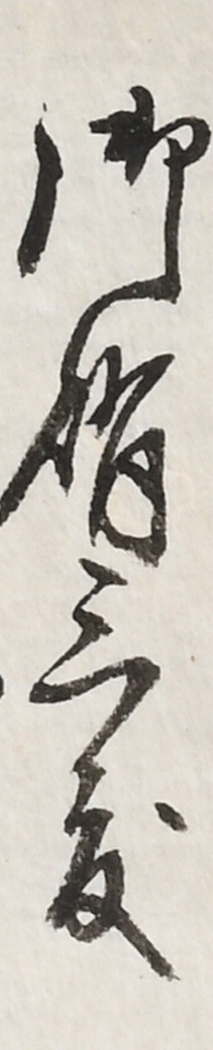御賄三度
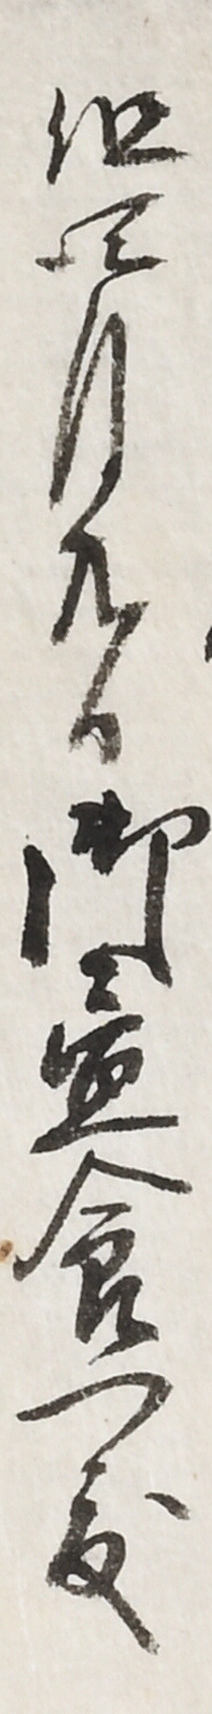但四月九日御昼食一度
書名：御巡見様町方御泊相数書上覚
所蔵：伊那市立高遠町図書館・合同会社AMANE
